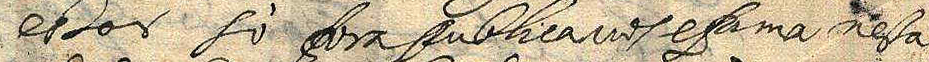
estar sò fora publica uos e fama nesta
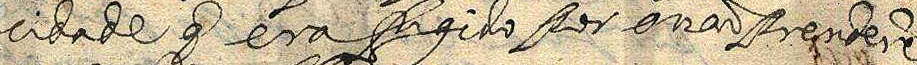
cidade q̄ era fugido por o naõ prenderē
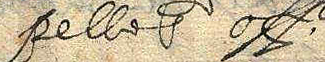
pello sto off.o.
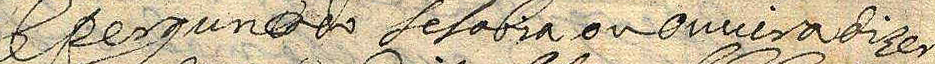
E perguntado se sabia ou ouuira dizer
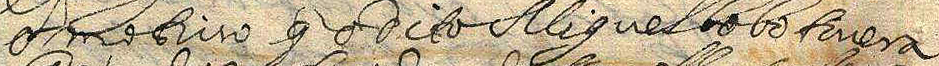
o motiuo q̄ o dito Miguel lobo tiuera
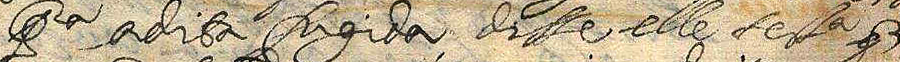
pra a dita fugida disse elle testa q̄
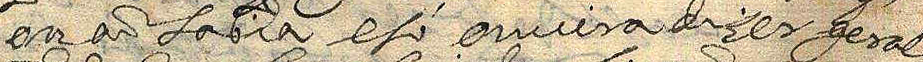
o naõ sabia e só ouuira dizer geral
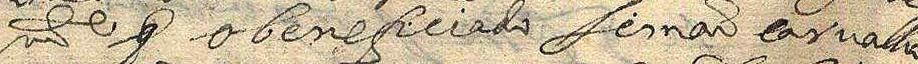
mte q̄ o beneficiado simaõ carualho
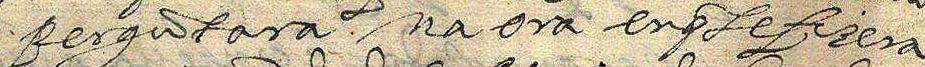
perguntara na ora en q̄ se fizera
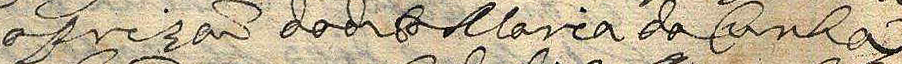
a prizaõ da dita Maria da Cunha
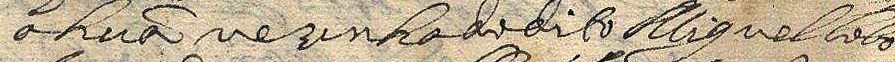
a huā uezinha do dito Miguel lobo
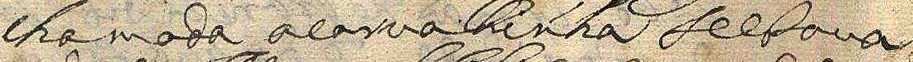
chamada a carualhinha se estaua
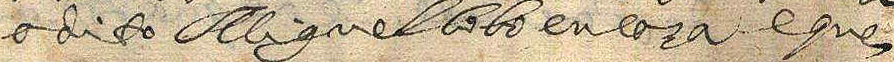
o dito Miguel lobo en caza e que
